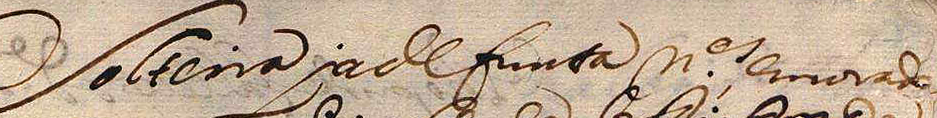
Solteira ja defunta n.al e morado
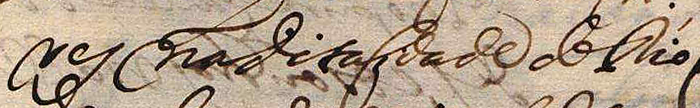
res na dita Cidade do Rio
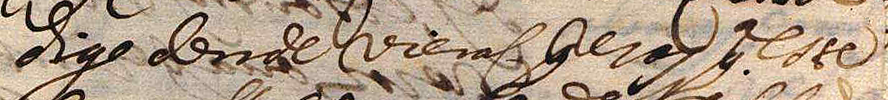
digo donde vierā pRezas pa este
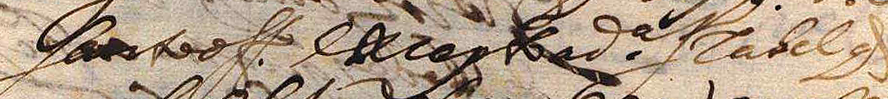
santo off.o excepto a d.a Jzabel q̄
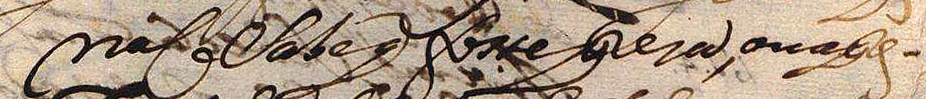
nā Sabe q̄ fosse preza, ou apRe
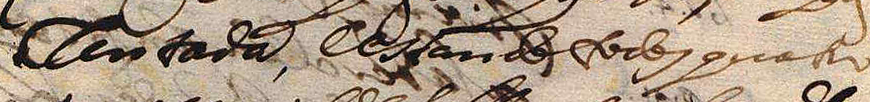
Zentada, e estando todos quatro
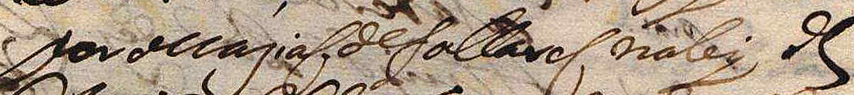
por occaziā de fallarē na ley de
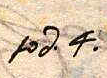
tod. 4.
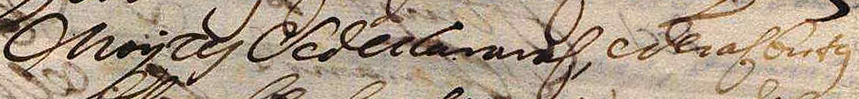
Moyzes Se declararā, e derā Contas
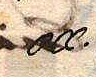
occ.
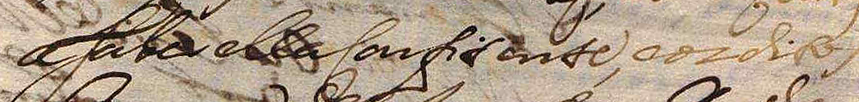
a saber ella Confitente, e os ditos
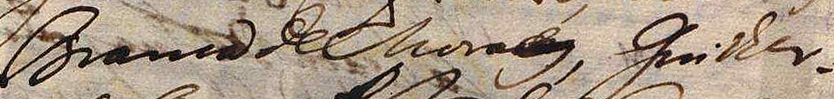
Branca de Moraes, Guilher.
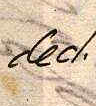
decl.
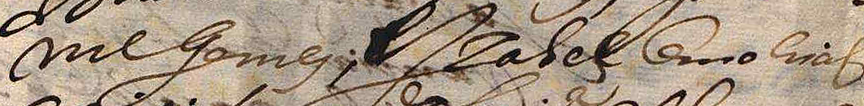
me Gomes, e Jzabel Como Crī
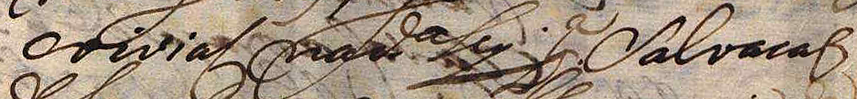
e viviā na d.a ley q̄ Salvaçā
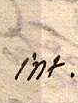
int.
